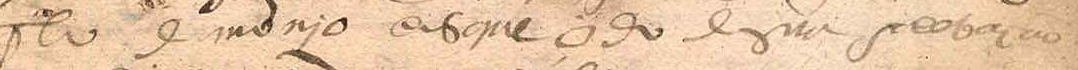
p̄lo demonjo e esquecido de sua sallvação
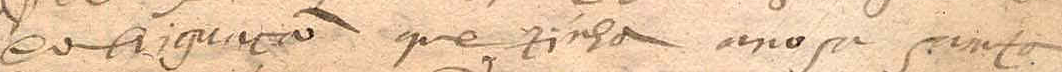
e obriguaçaõ que tinha a nosa samta
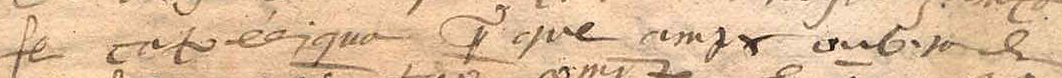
fe catolljqua p̄oque amtes ouvera de
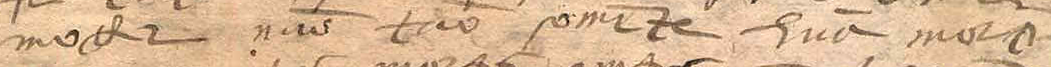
moRer não taõ somēte huā morte
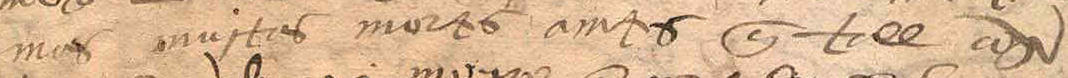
mas mujtas mortes amtes q̄ tall cōsē
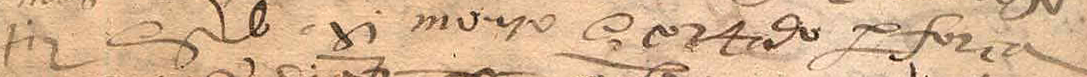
tir e sēdo asi mouro e cortado ꝑ força
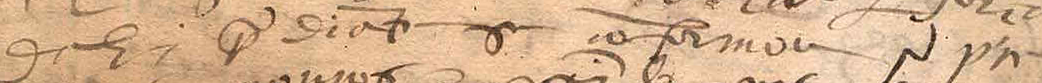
dahj p̄o diāte se c̄oformou sēpre
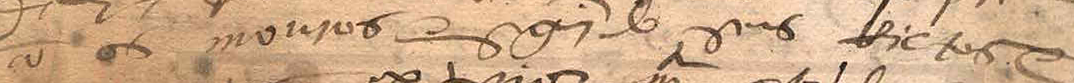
cō os mouros e seguīdo seus Rictos e
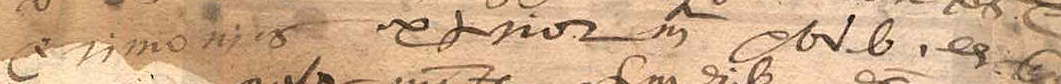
cerimonias exteriormte e vēdo elle q̄
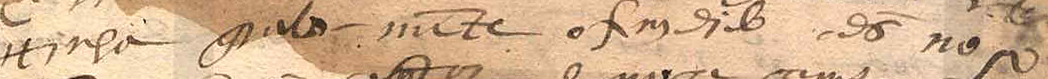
tinha gravemēte ofemdido a ds̄ noso
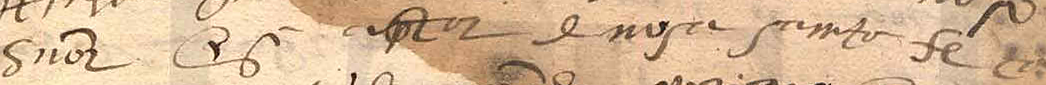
Snōr ē se ap̄tar de nossa samta fe ca
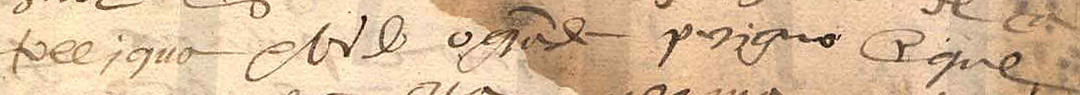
tolljqua e vēdo o grāde periguo ē que
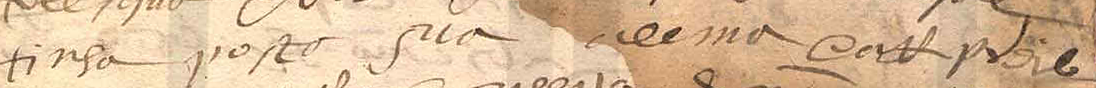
tinha posto sua allma e aRepēdido
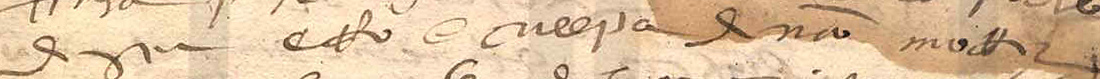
de seu eRo e cullpa de não moRer
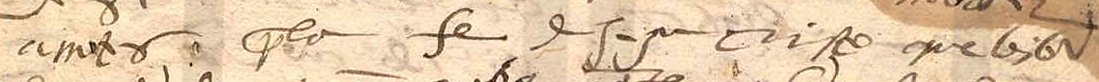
amtes p̄la fe de Jezu cristo que vivē
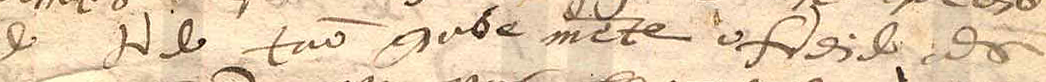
do tēdo taõ gravemēte ofēdido a ds̄
